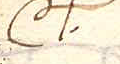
et.
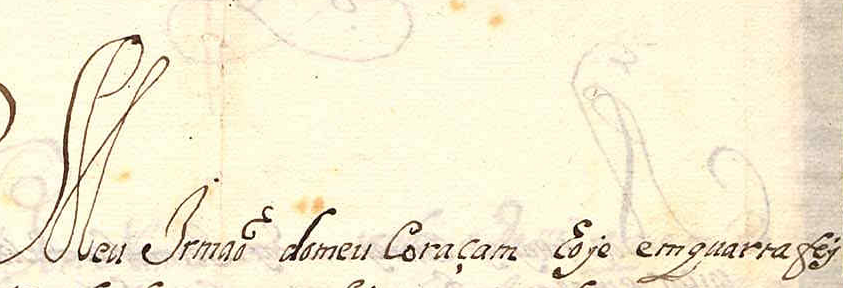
Meu Irmaõ do meu Coraçam hoje em quarta fej
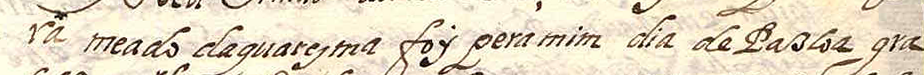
ra meado da quaresma foy pera mim dia de PasCoa gra
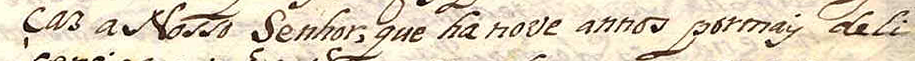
ças a Nosso Senhor, que ha nove annos por mais deli
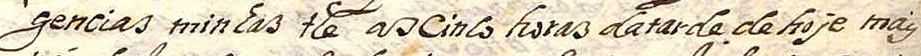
gencias minhas the as cinco horas da tarde de hoje mais
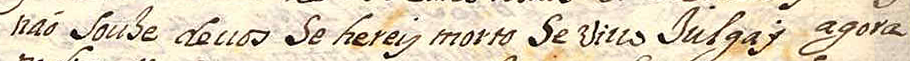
naõ soube de uos Se hereis morto Se viuo Iulgay agora
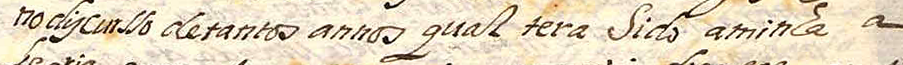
no discursso de tantos annos qual tera Sido a minha a
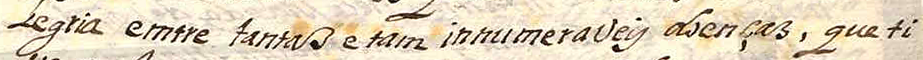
Legria, emtre tantas, e tam innumeraveis doenças, que ti
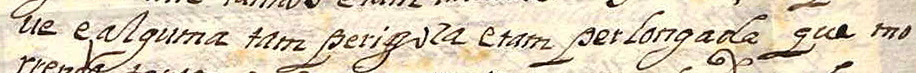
ue e alguma tam perigoza e tam perlongada que mo
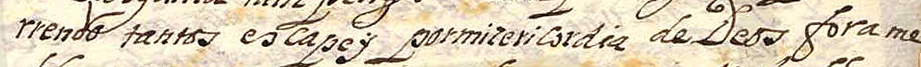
rrendo tantos escapey por mizericordia de Deos fora me
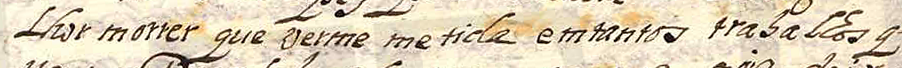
Lhor morrer que verme metida em tantos trabalhos q
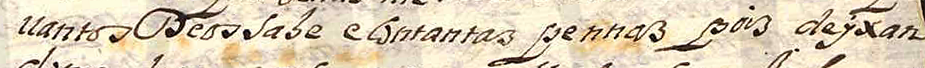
uantos Deos sabe e con tantas pennas pois deyxan
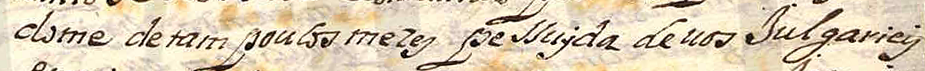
dome de tam pouCos mezes pessciyda de uos Iulgarieis
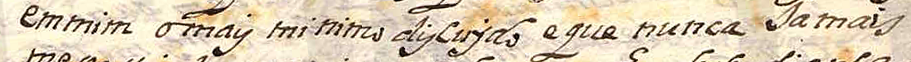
em mim o mais intimo disCuydo e que nunca Iamais
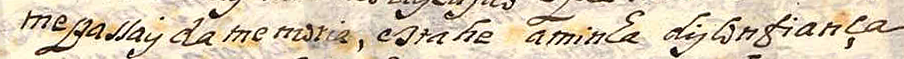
me passais da memoria, esta he a minha disConfiança
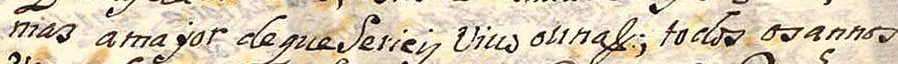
mas a mayor de que Serieis viuo ou naõ; todos os annos
